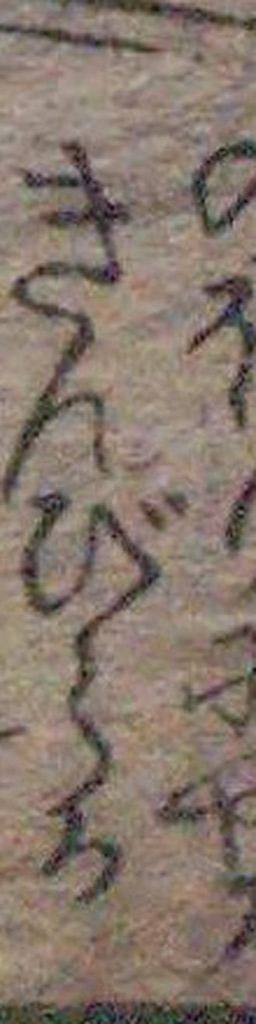きんびらか
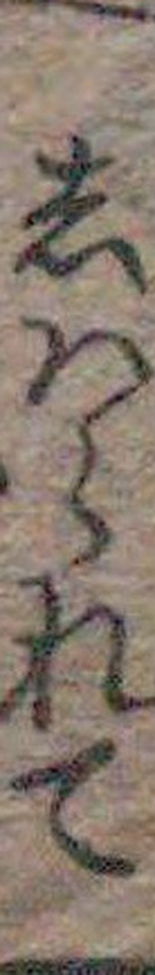しはられて
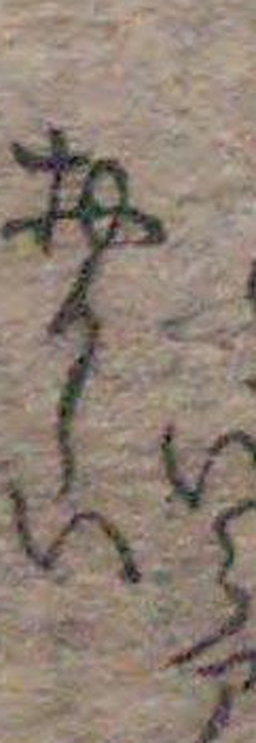おかしい
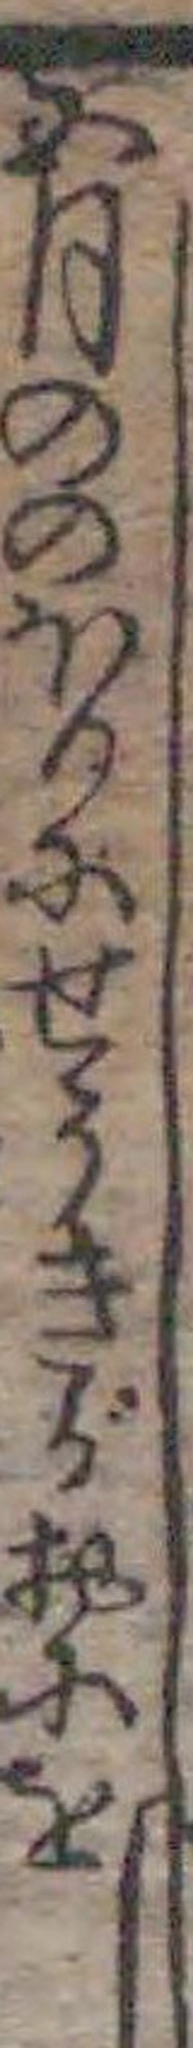五月ののほりにせうきがおにを
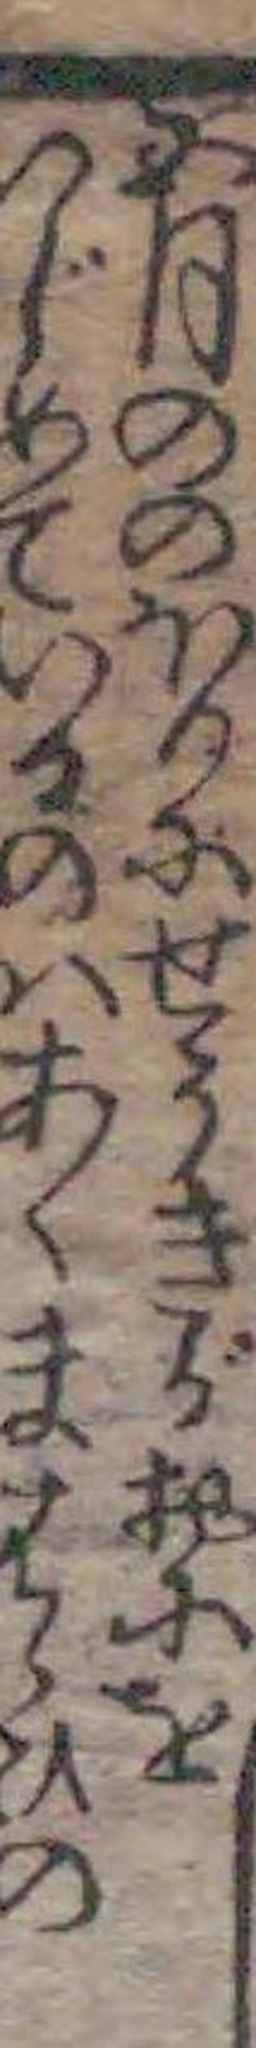いじめているのはあくまはらひの
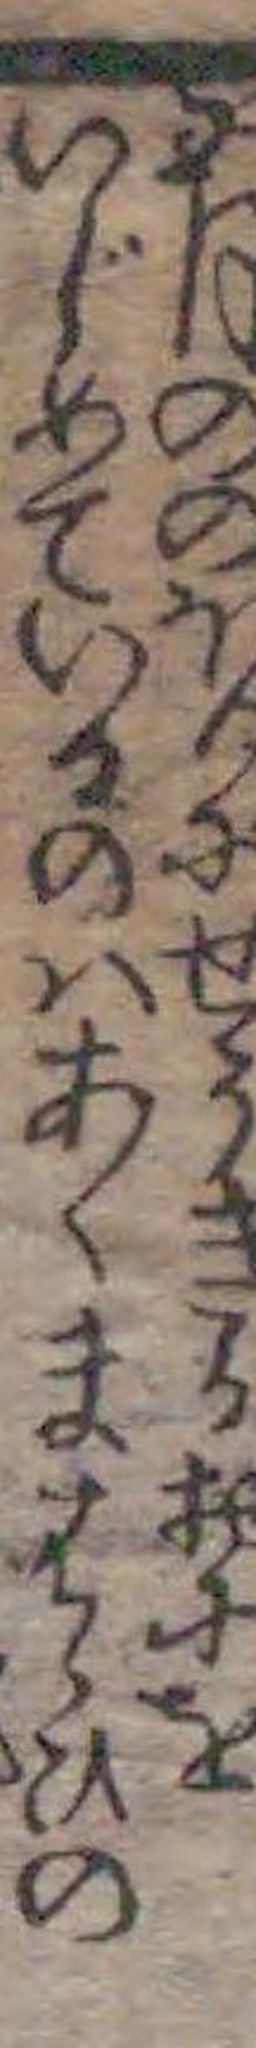いじめているのはあくまはらひの
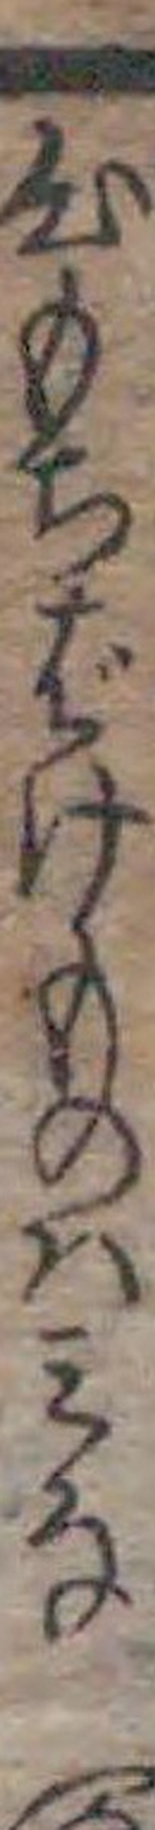心もちばけものはみな
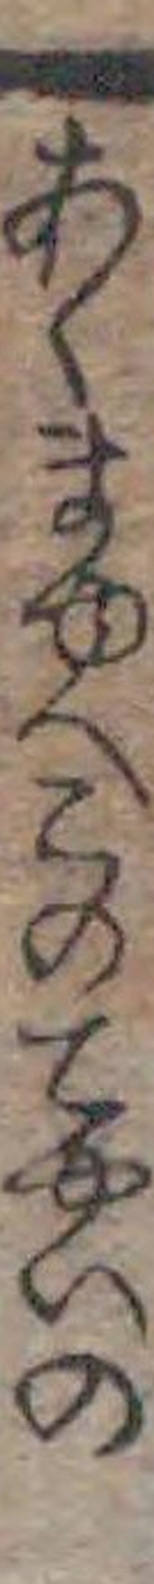あくまゆへこのてやいの
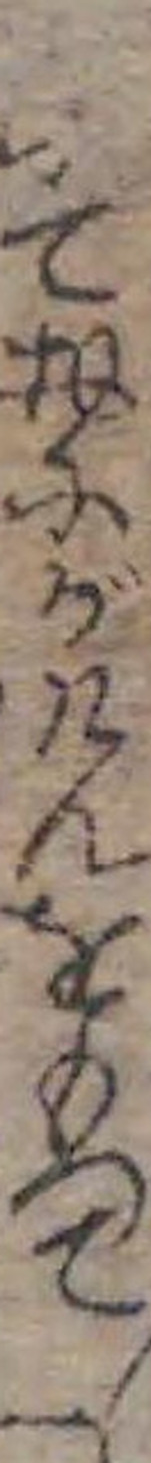にておにがけんをもつて
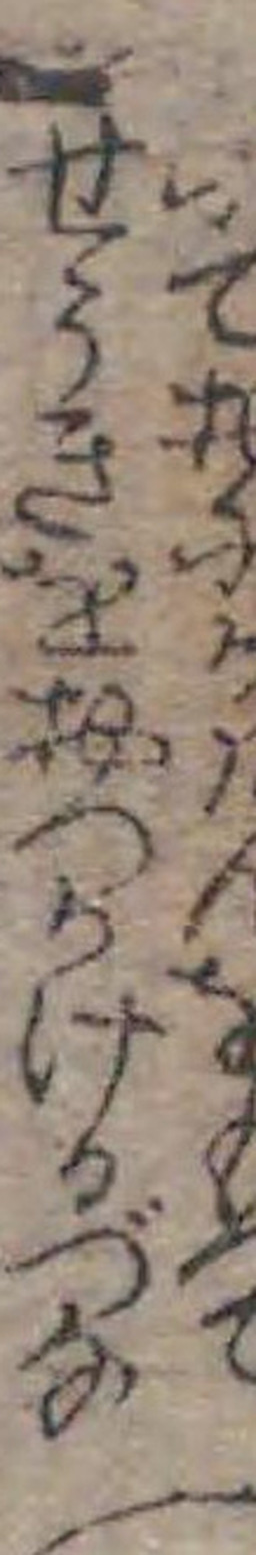せうきをおつかけるづな
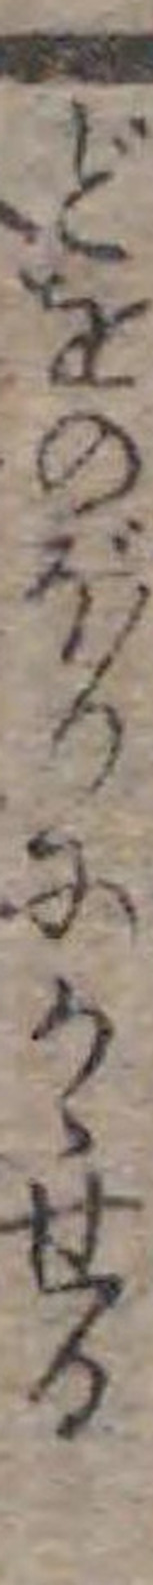どをのぼりにかゝせる
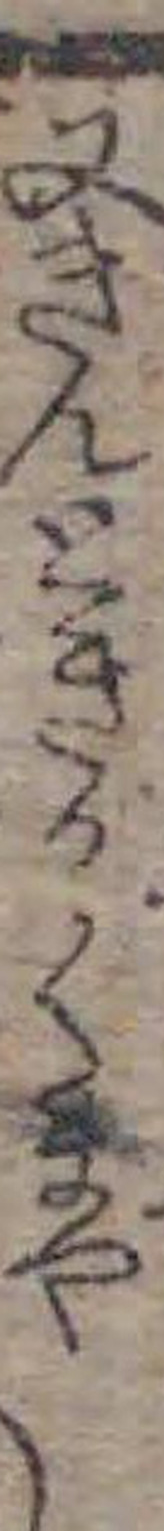又きんときがくまや
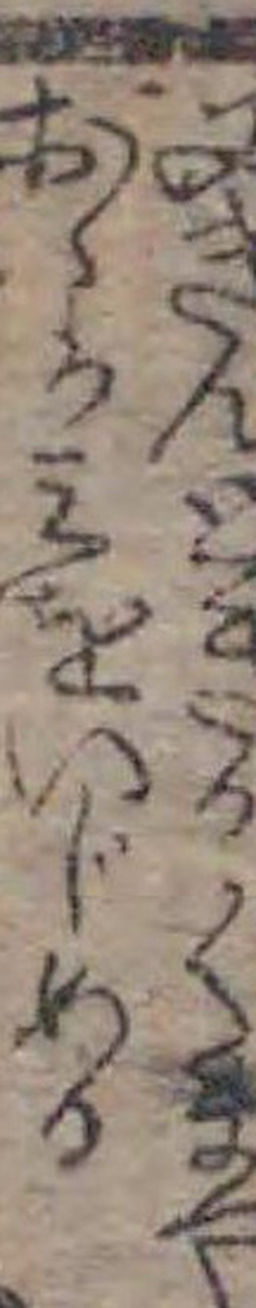おゝかみをいじめる
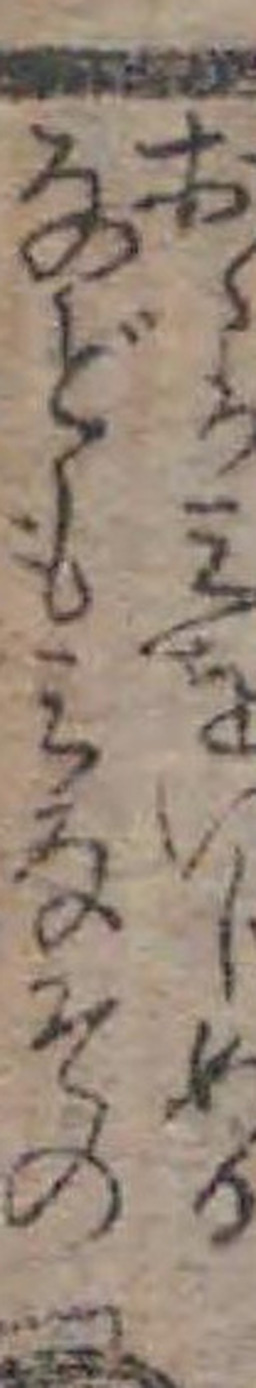などもみなその
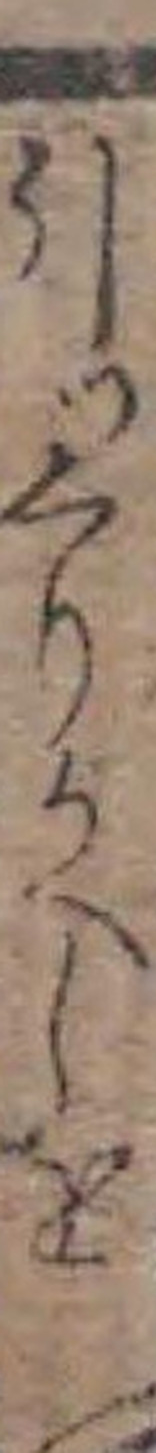引っくりかへしを
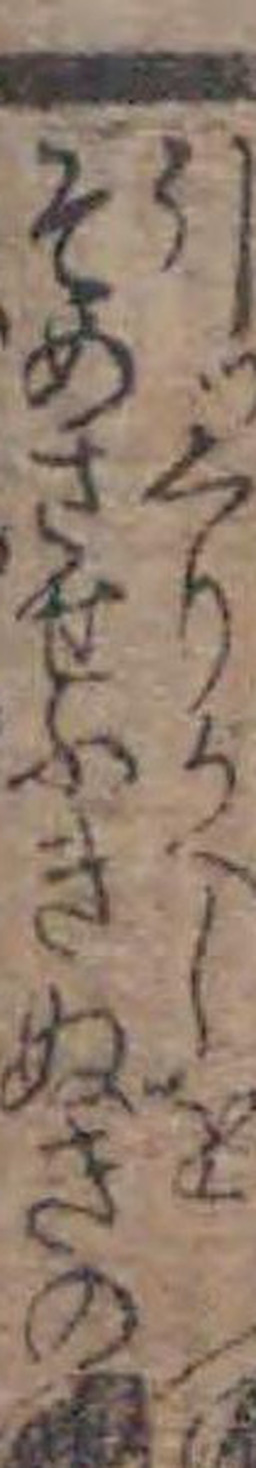そめさせふきぬきの
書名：年中行状記 : 2巻
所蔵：国立国会図書館 National Diet Library, JAPAN
